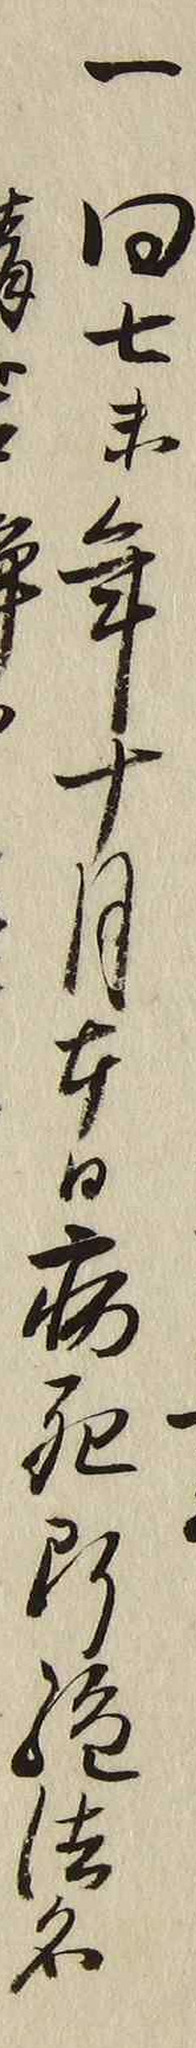一同七未年十月廿日病死断絶法名
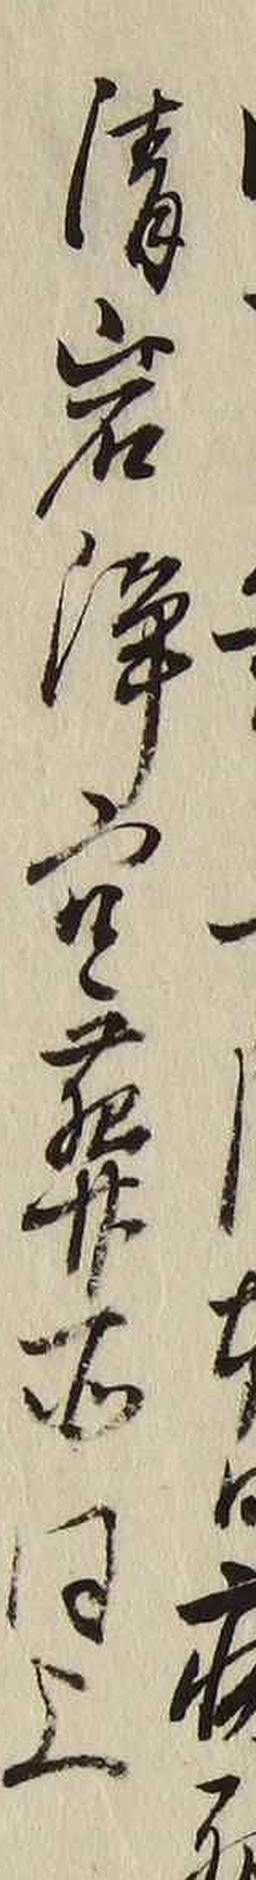清岩浄空葬所同上

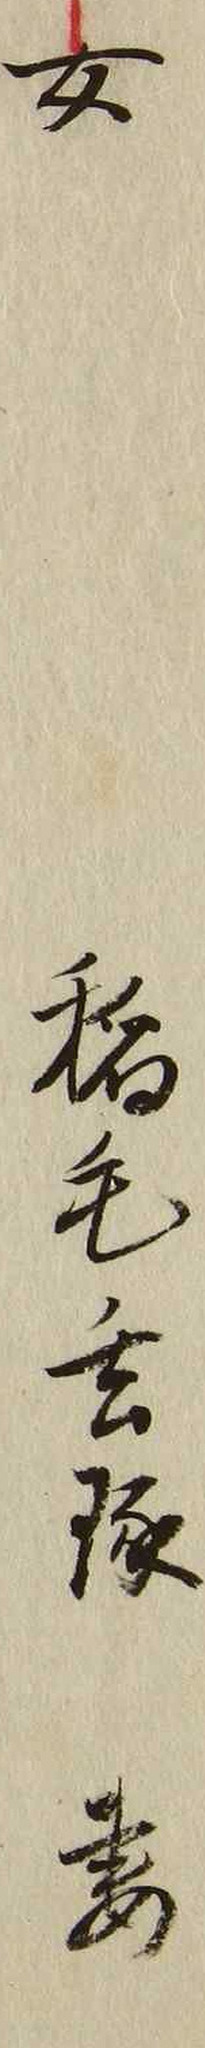女稲毛玄琢妻
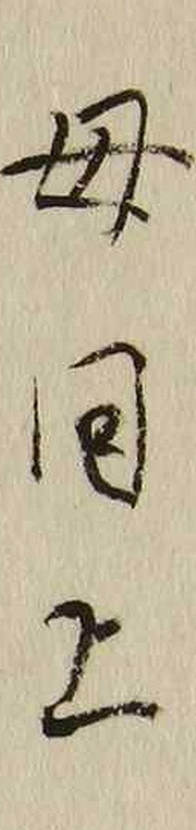母同上
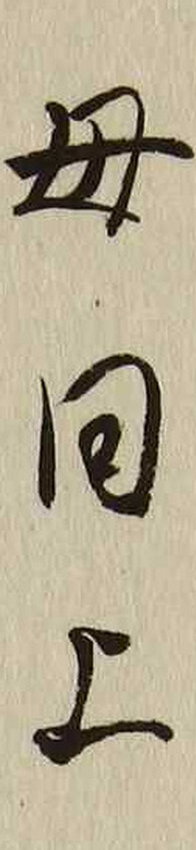母同上
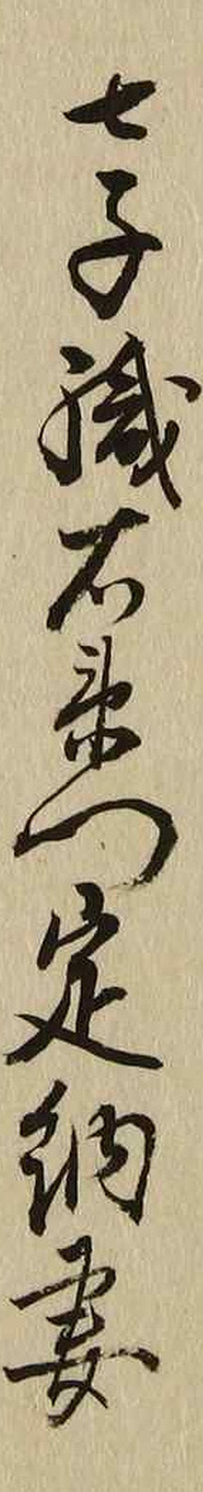女七子織右衛門定納妻
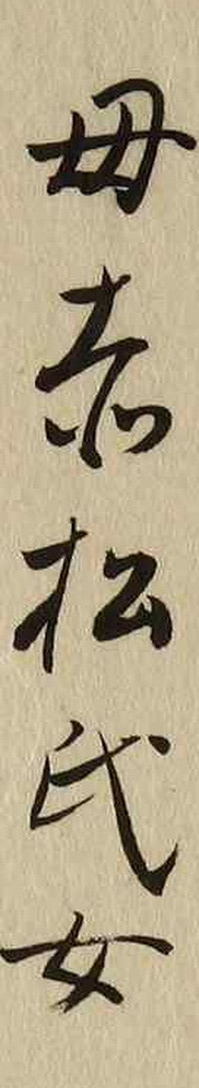母赤松氏女
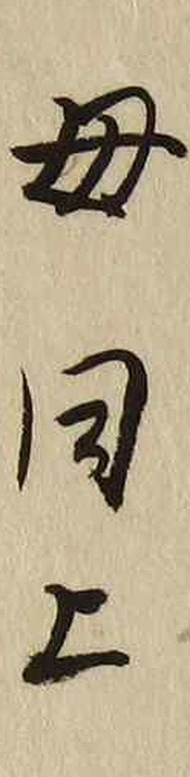母同上
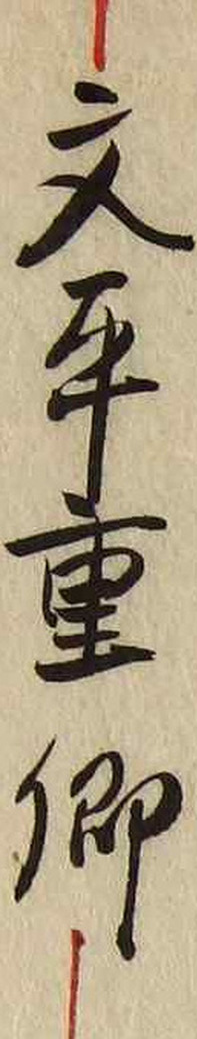文平重郷

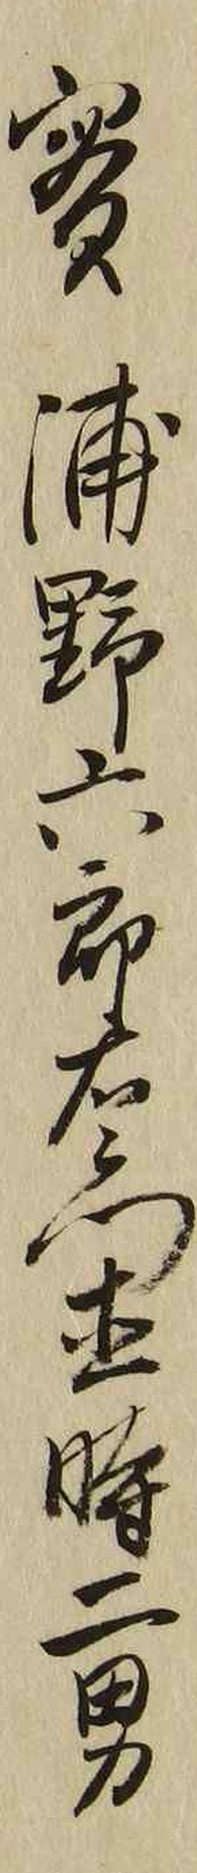実浦野六郎右衛門直時二男
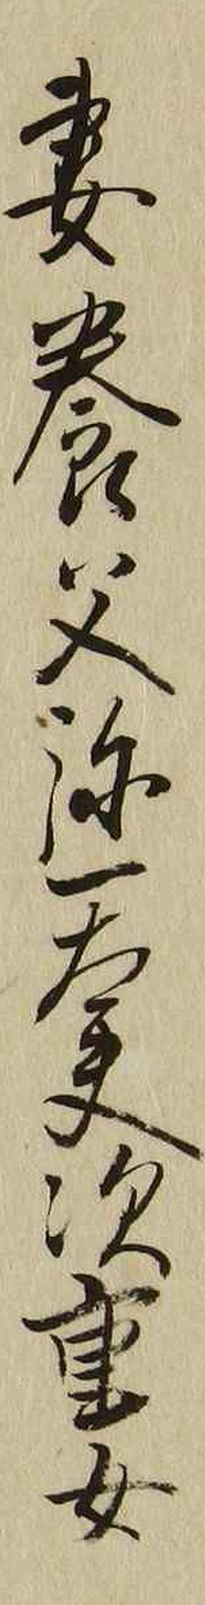妻養父弥一太夫次重女
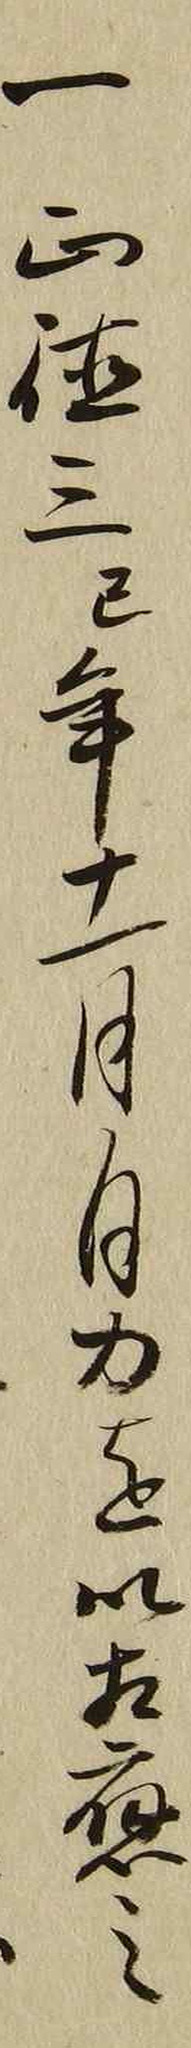一正徳三巳年十一月自力を以相応之
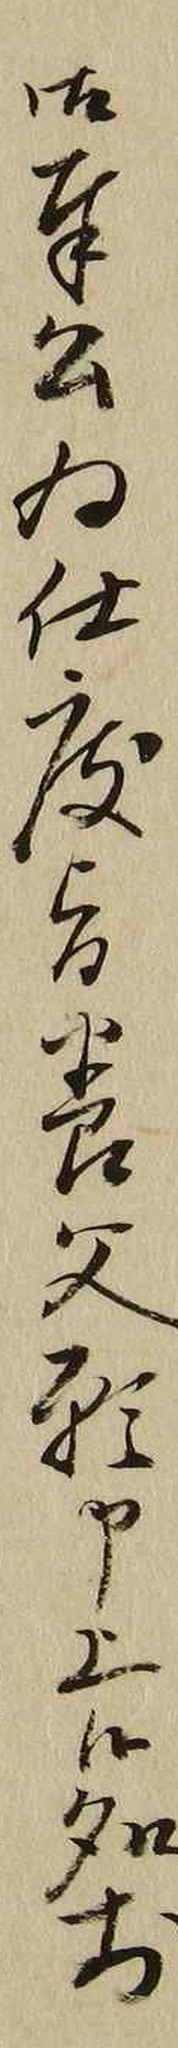御奉公為仕度旨養父願申上候処於
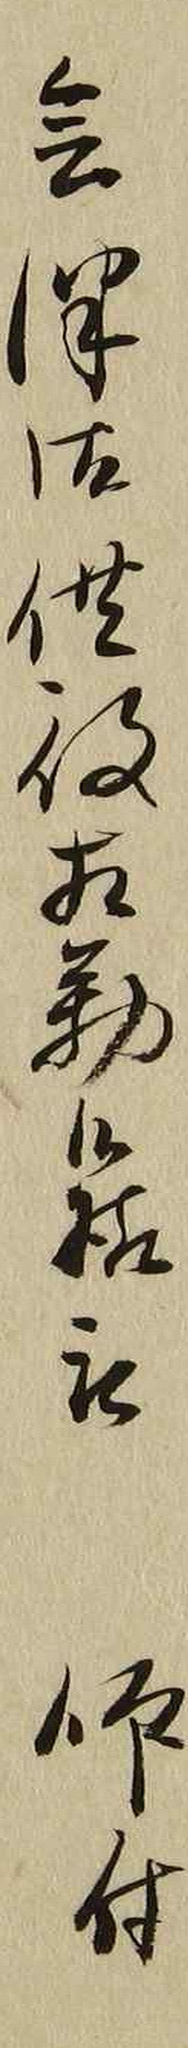会津御供役相勤候様被仰付
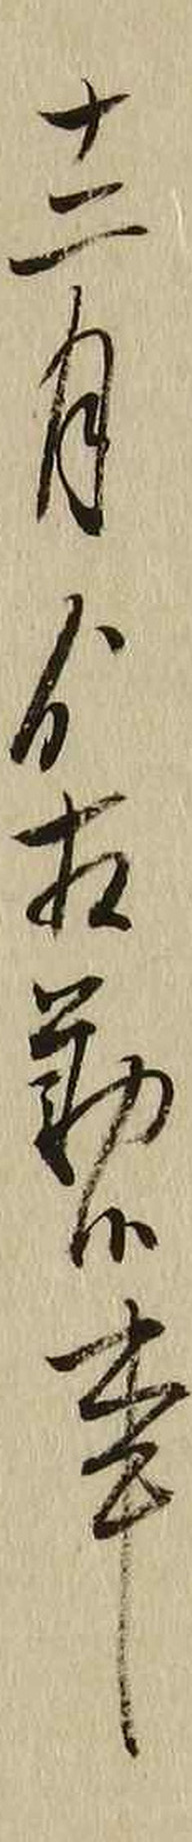十二月ゟ相勤候事
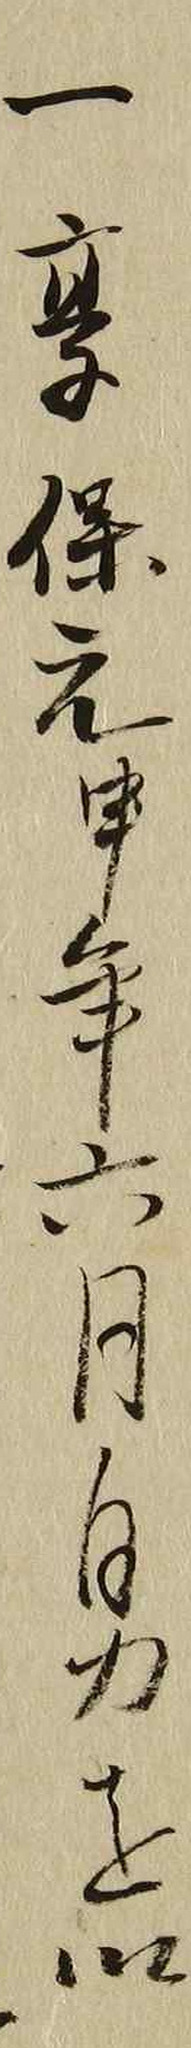一享保元申年六月自力を以
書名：諸士系譜　巻之348　も之部4
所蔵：会津若松市立会津図書館
